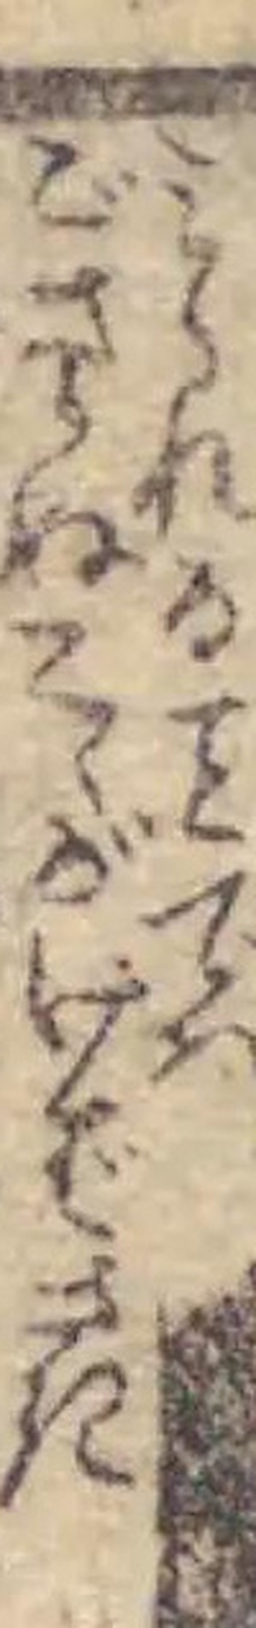ござらぬこゝがけばさき
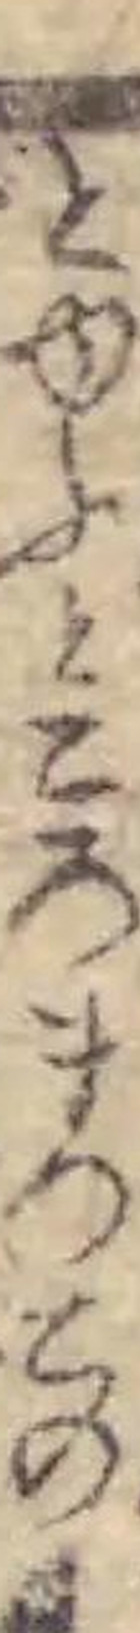とゆふところまつこの
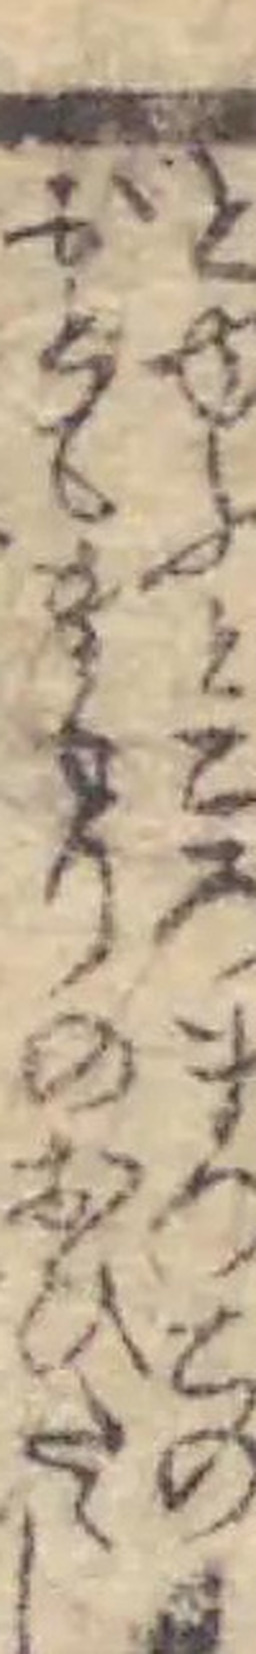おともまもりのおひたゝしい
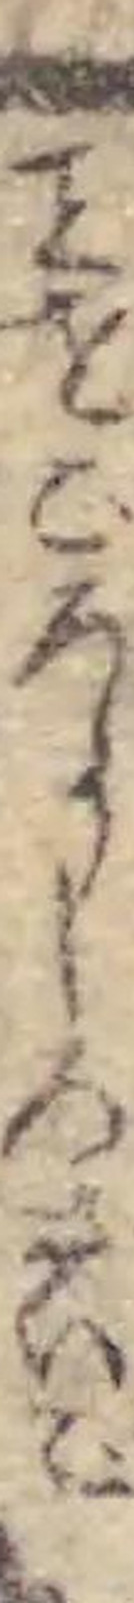ことをごろうしろざいで
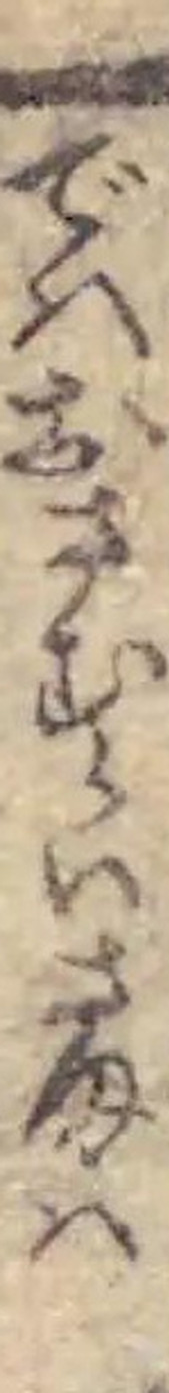でハおさむらいさまハ
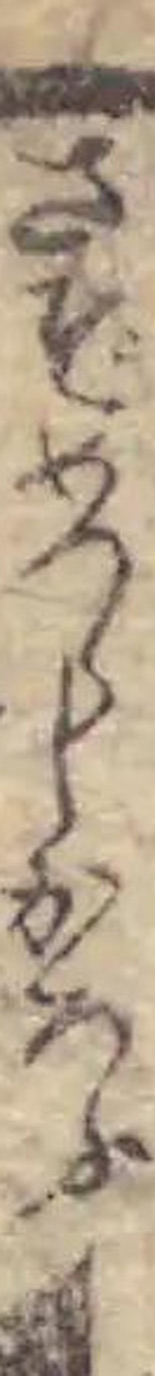さぞめつらしかろふ
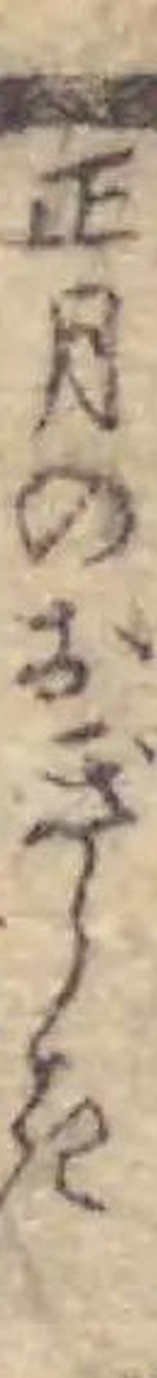正月のおぎしき
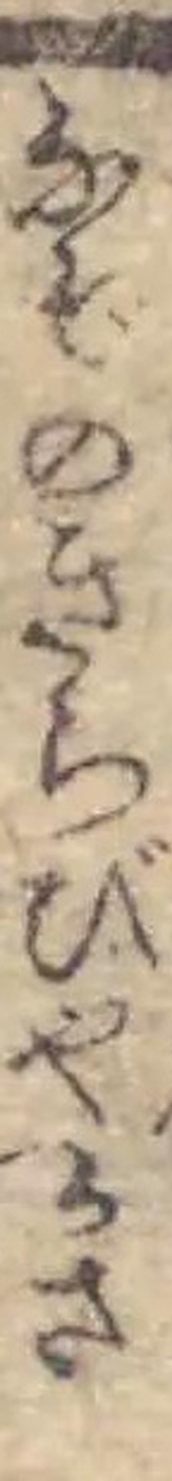なぞのきらびやかさ
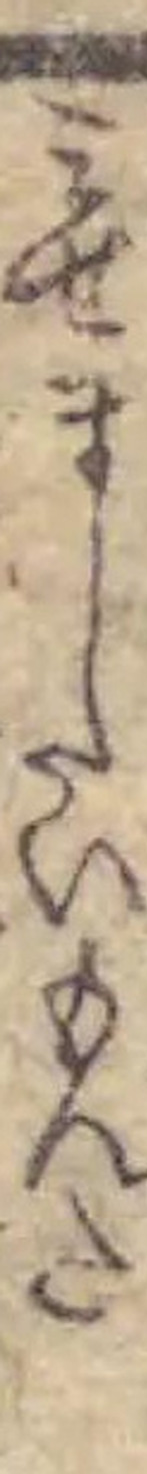ミせましたいもんた
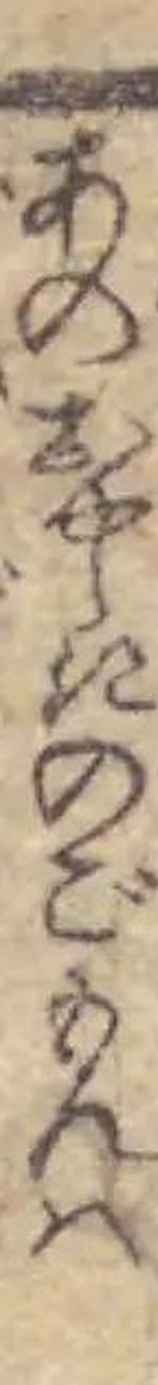おのおやしきのごもんハ
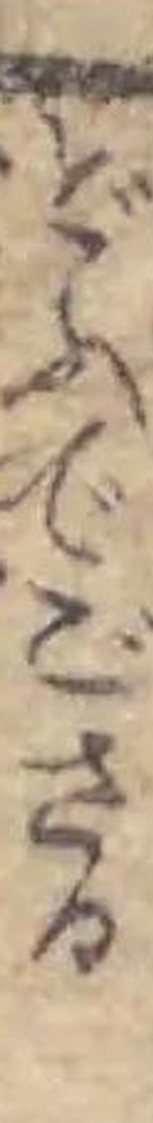どふでごさる
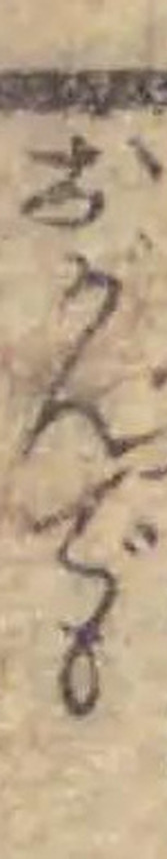おがんでも
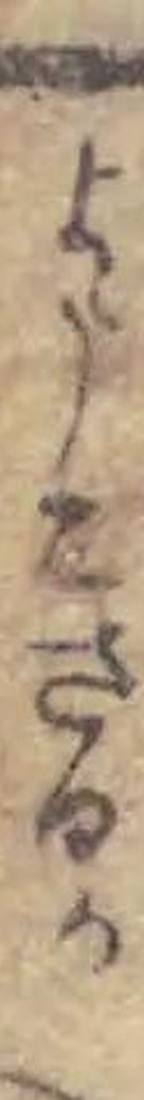ようこさるか

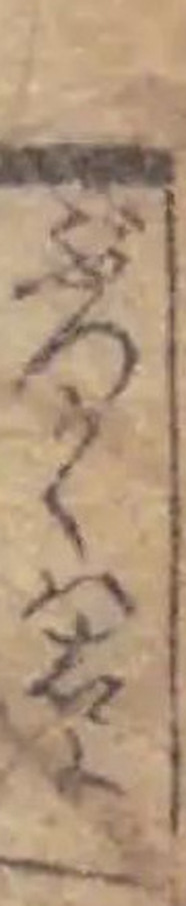ぶつかくハしよ
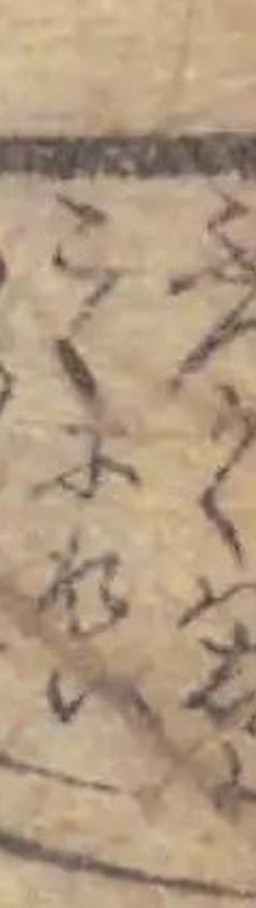こくにれい
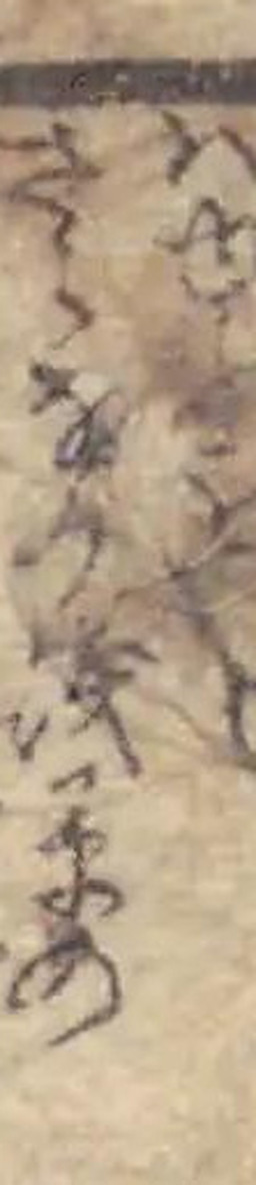さらなり浅草の
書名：豆男江戸見物 2巻
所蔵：国立国会図書館 National Diet Library, JAPAN
